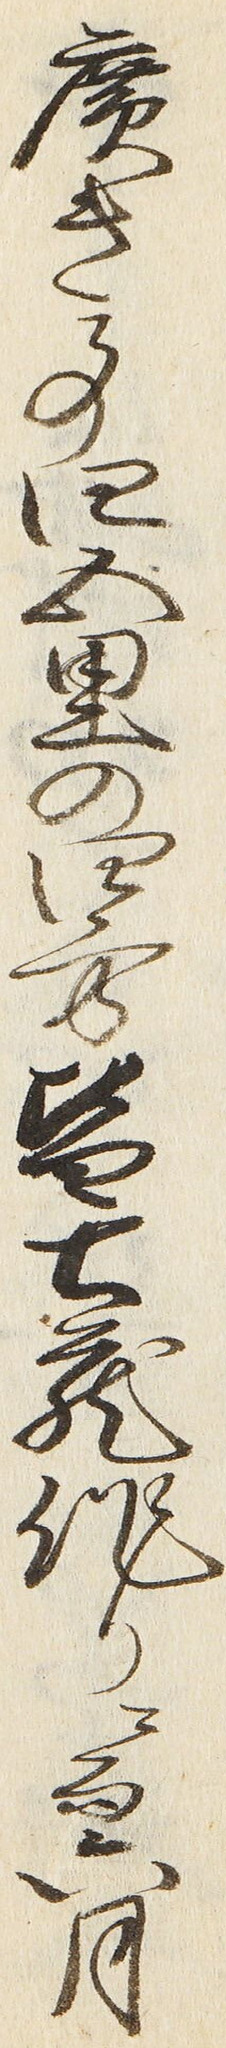広き事四五里の四方皆土蔵作りにて六月
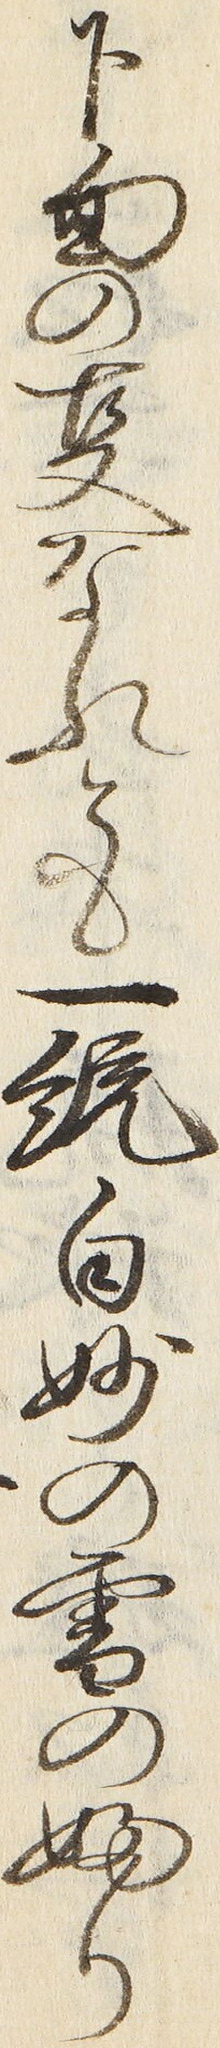下旬の事なれとも一統白砂の雪のふり
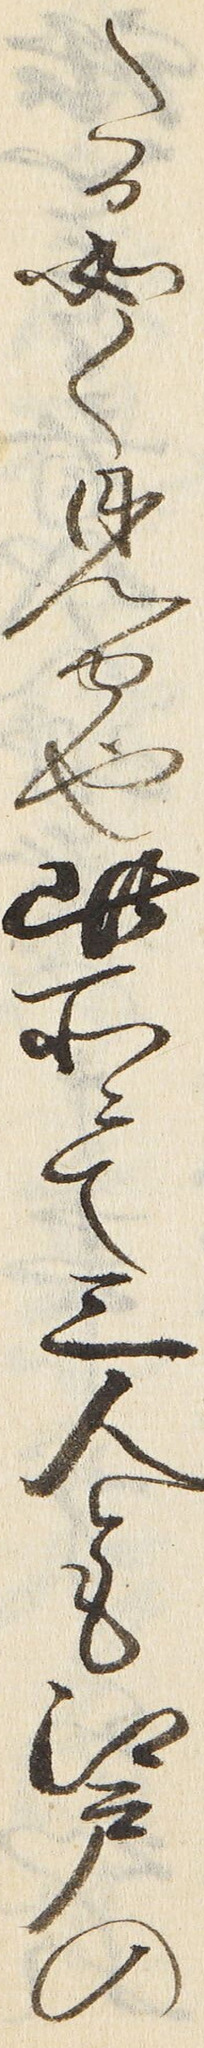たる如く見ゆ也此所にて三人とも江戸の
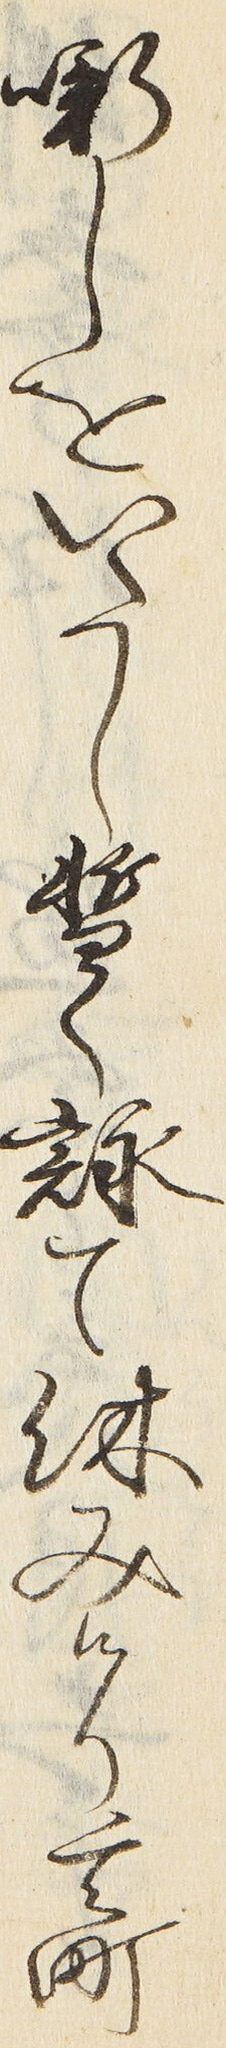噺しをいたし暫く詠て休みけり其町
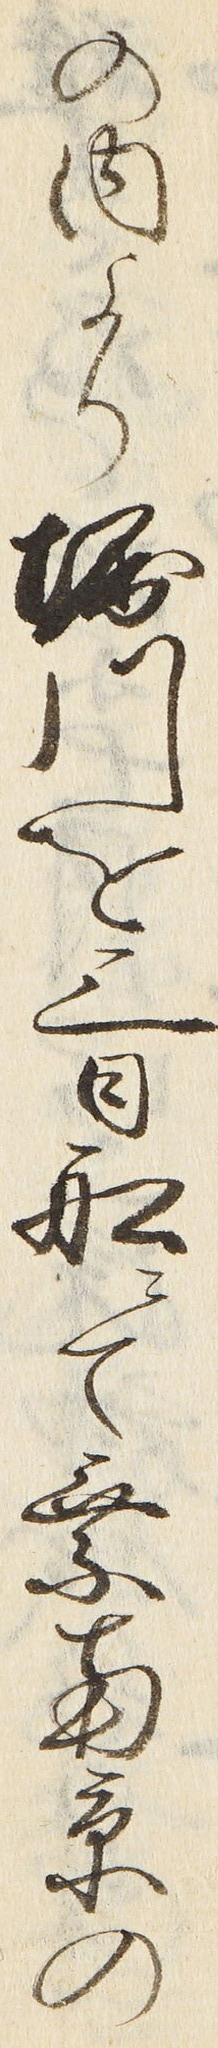の内より堀川を三日船にて乗なん南京の
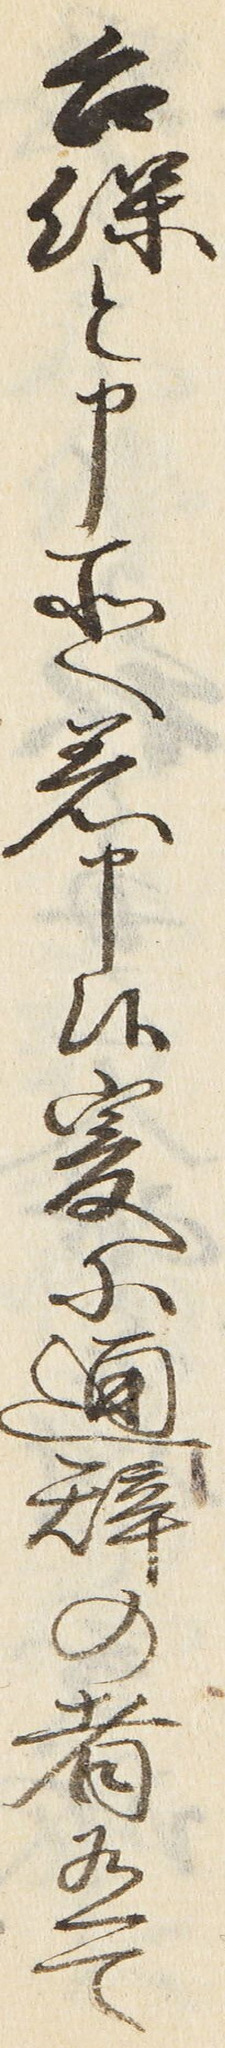台保と申所へ着申候爰に通辞の者有て
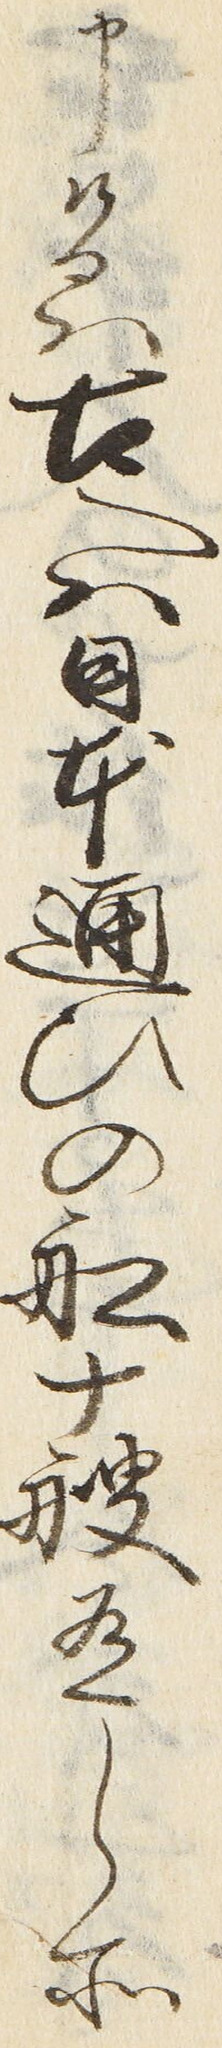申けるは右へは日本通ひの船十艘有し所
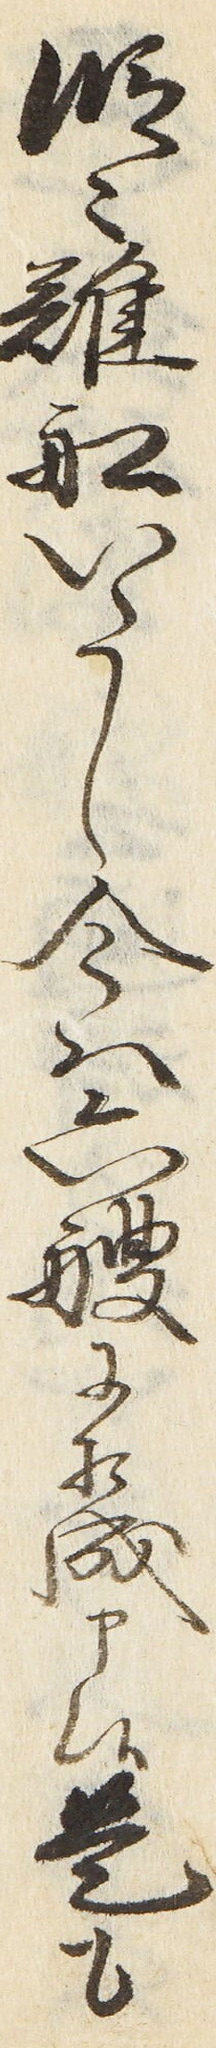段々難船いたし今は六艘に相成申候是も
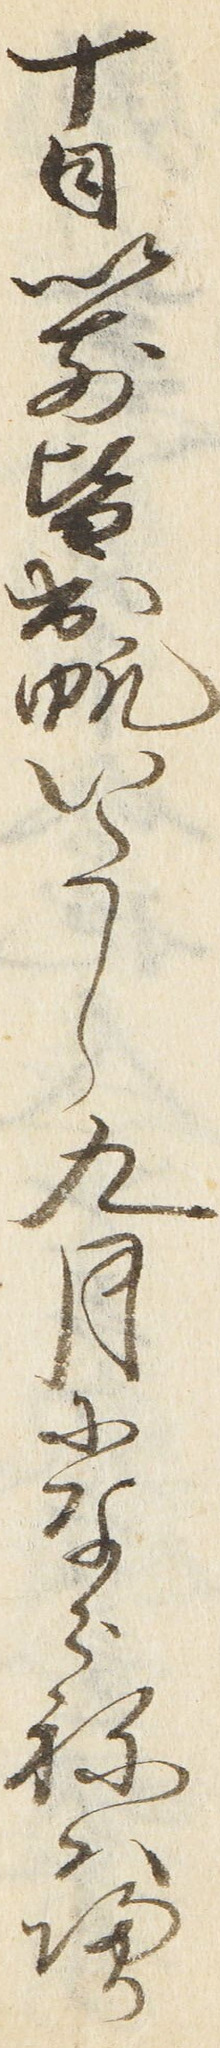十日以前皆出航いたし九月にならねは帰り
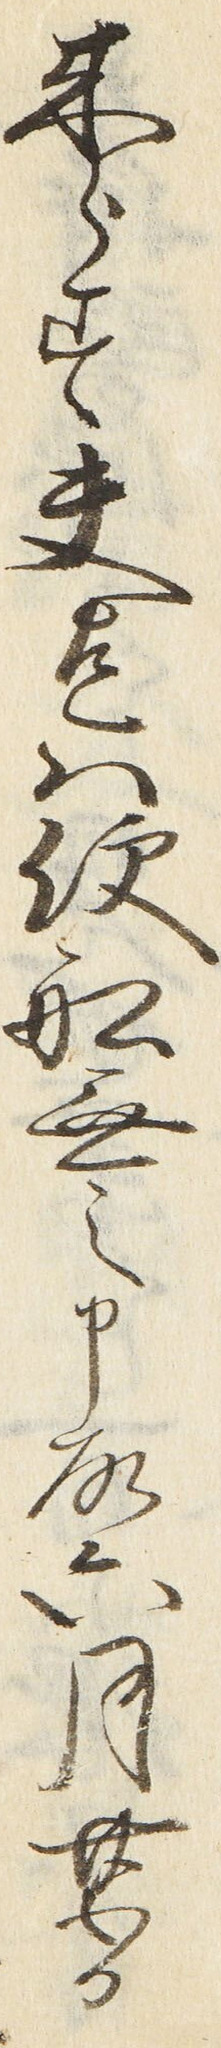来らす夫迄は便船無之申故六月廿五日
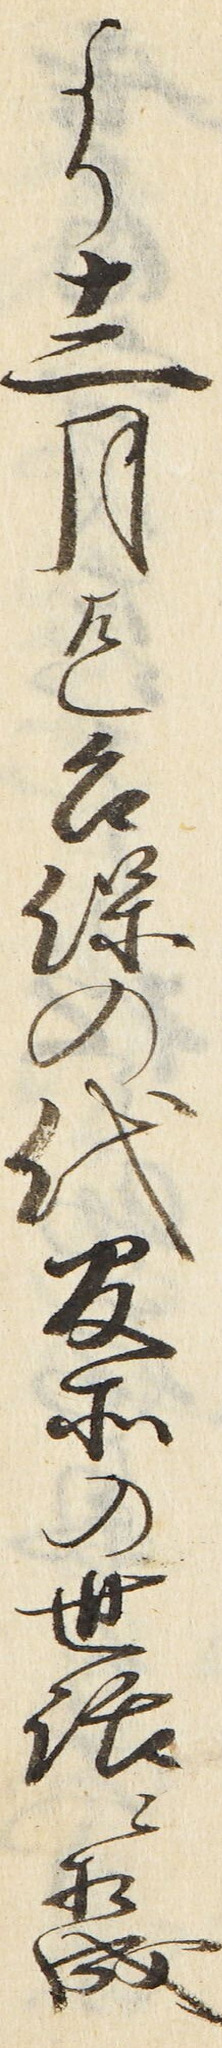より十二月迄台保の代官所の世話に相成

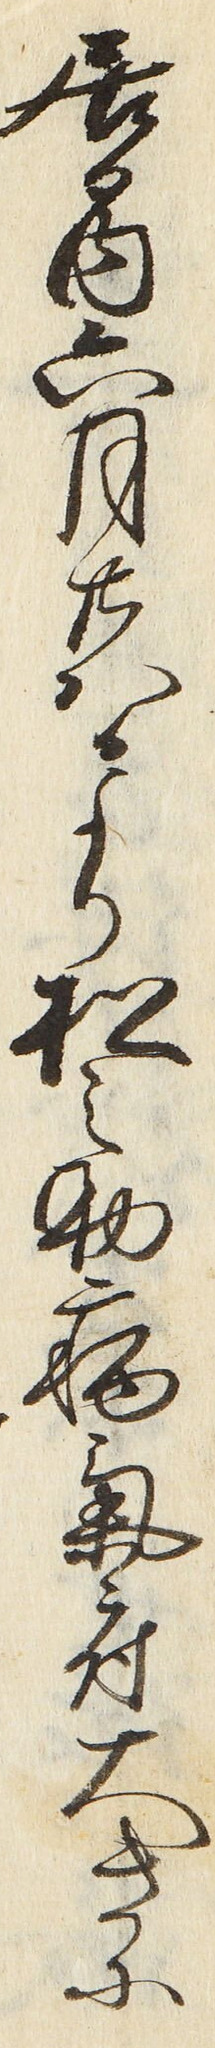居る内六月廿八日より松之助病気に付大きに
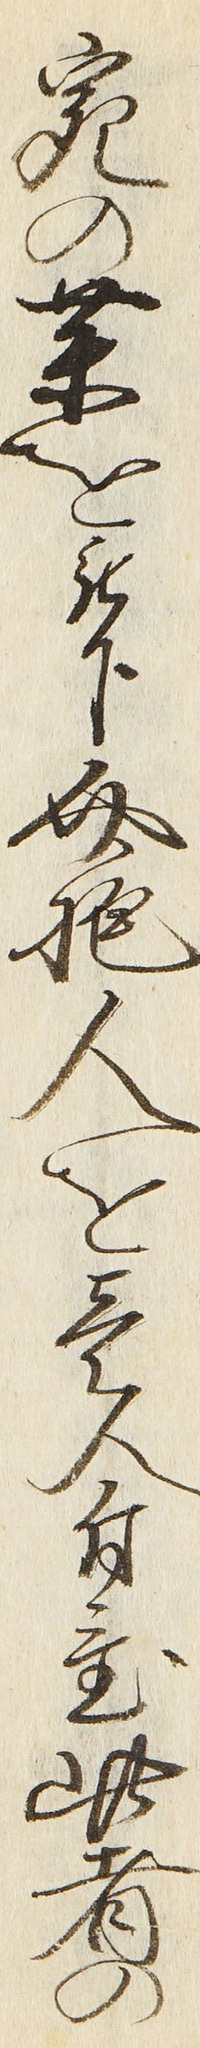宛の薬を被下介抱人を壱人付置此者の
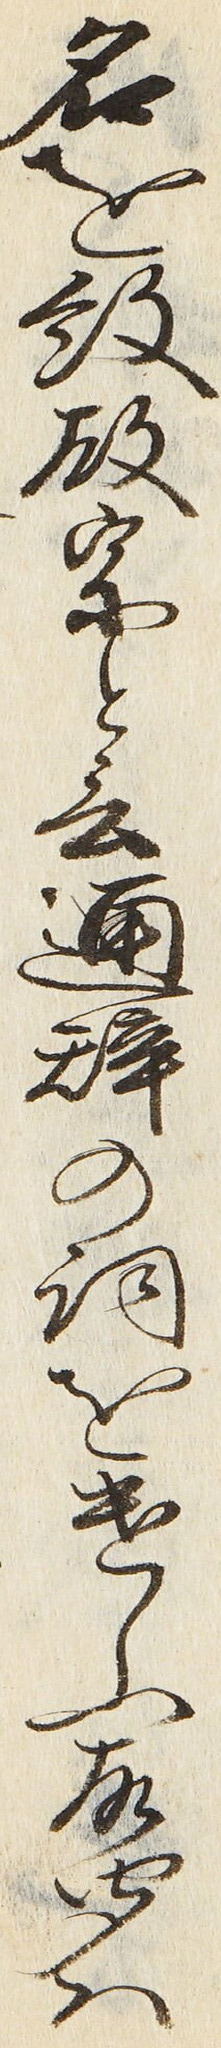名を紋故宗と云通辞の詞を遣ふ故聞は
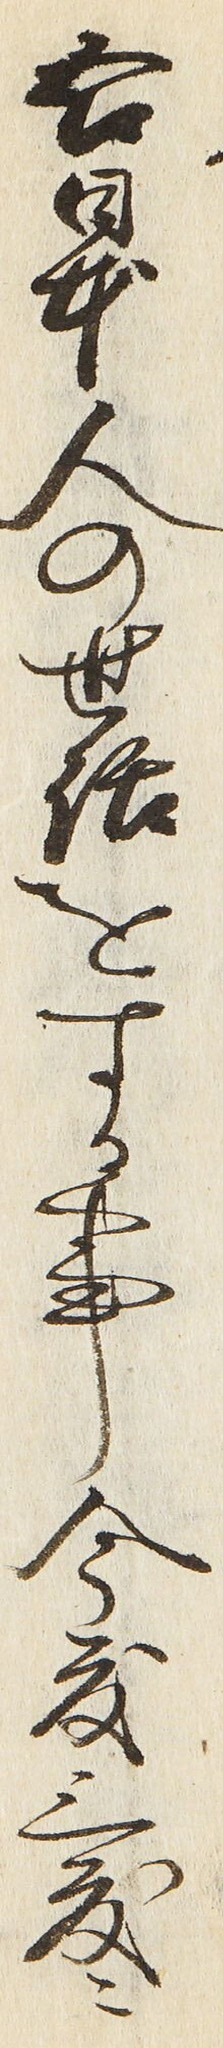右日本人の世話をする事今度三度に
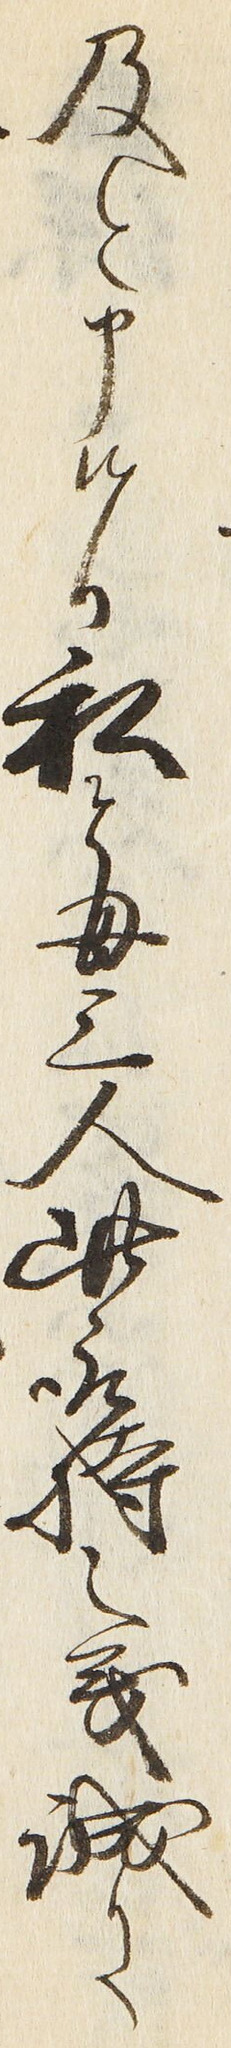及と申けり私とも三人此取持之義減りて
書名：天保漂流記
